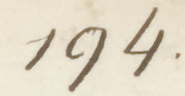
194
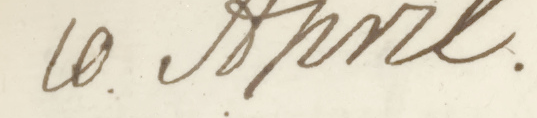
10 April.
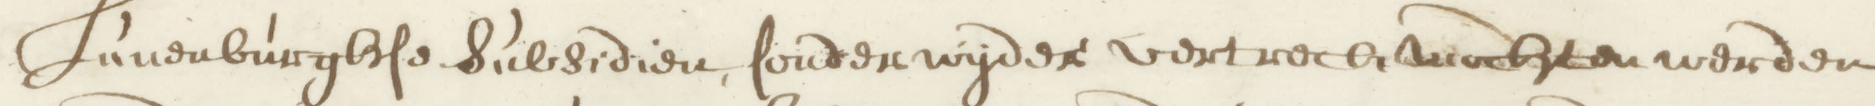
Lunenburghse Subsidien, sonder wijder vertreck mochten werden
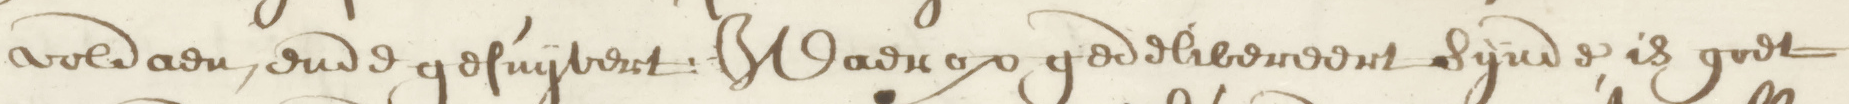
voldaen, ende gesuijvert: Waerop gedelibereert Sijnde is goet
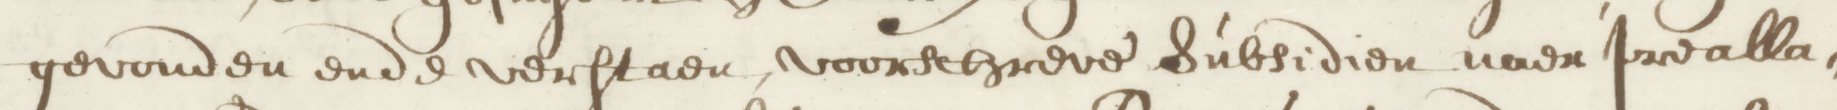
gevonden ende verstaen, voorschreve Subsidien naer prealla,,
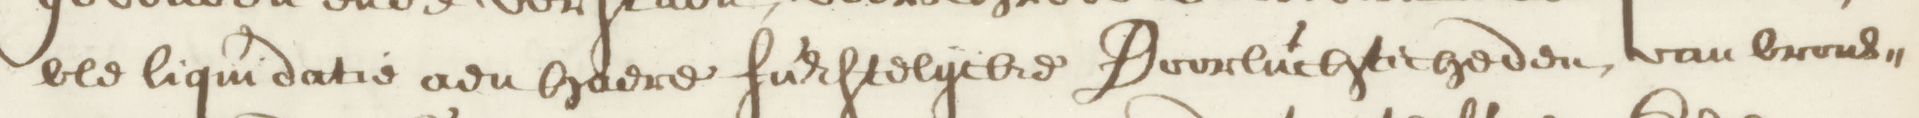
ble liquidatie aen haere furstelijcke Doorluchticheden, van bruns„
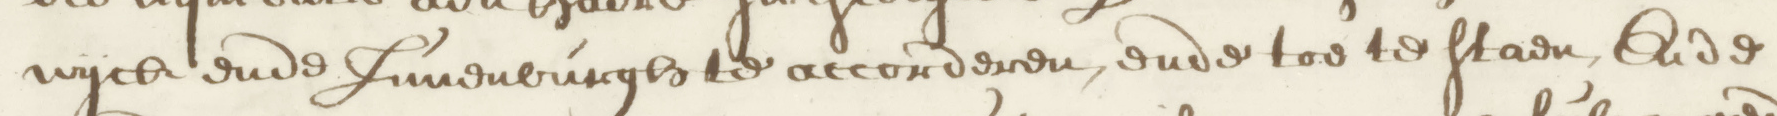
wijck ende Lunenburgh te accorderen, ende toe te staen, Ende —
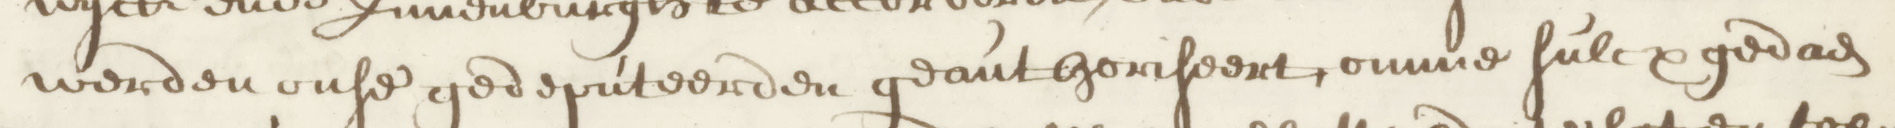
werden onse gedeputeerden geauthoriseert, omme sulcx gedaen
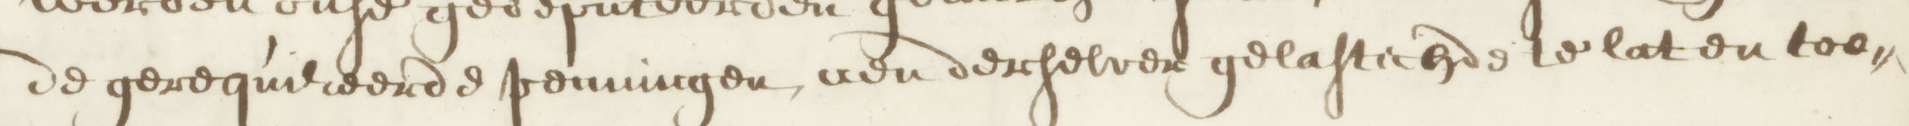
de gerequiereerde penningen, aen derselver gelastichde te laten toe„
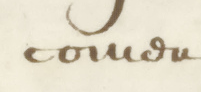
comen.
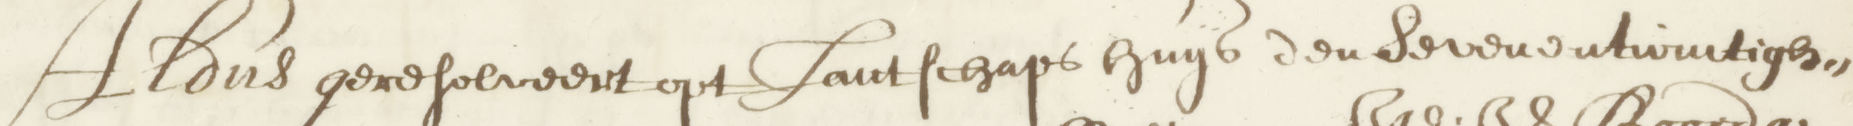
Aldus geresolveert opt Lantschaps huijs den Sevenentwintigh,,
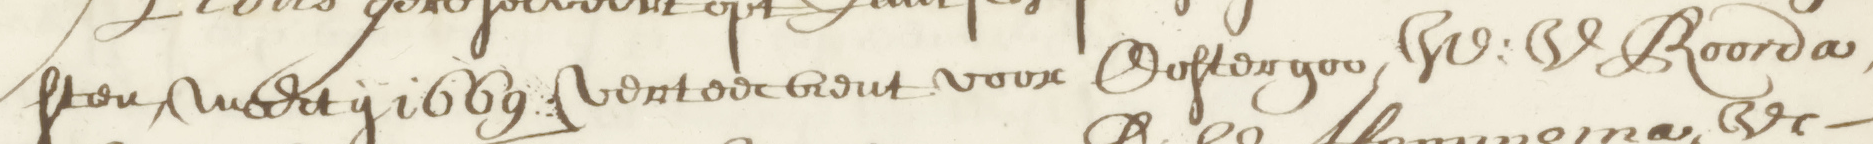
sten, meertij 1669. Verteeckent voor Oostergoo W: V. Roorda
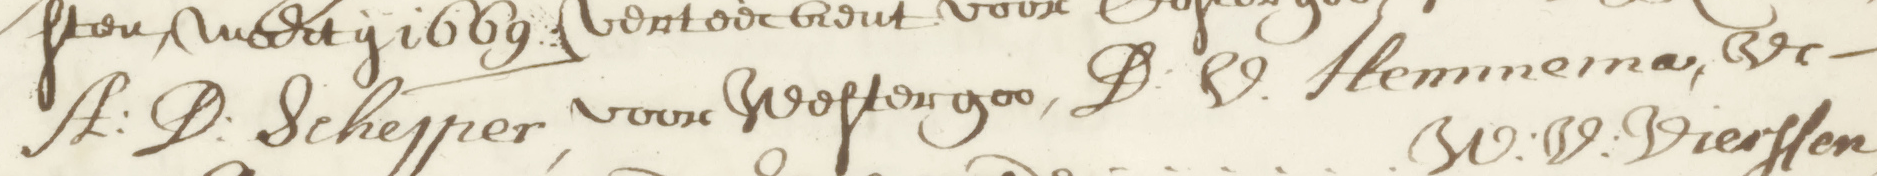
A:D: Schepper, voor Westergoo, D: V. Hemmema, V —
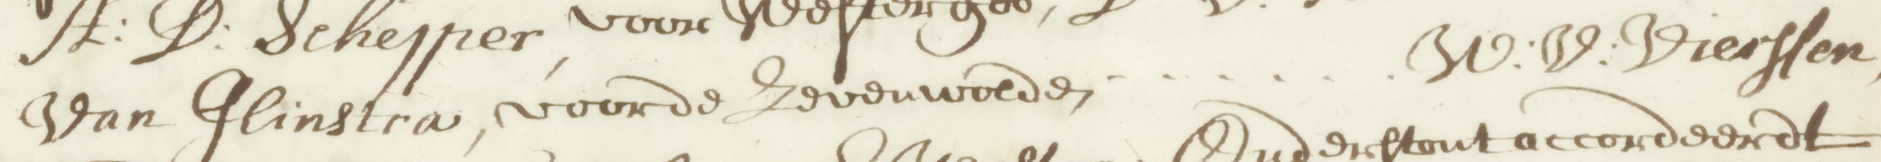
van Glinstra, voorde Zevenwolden . . . . . . W:V: Vierssen
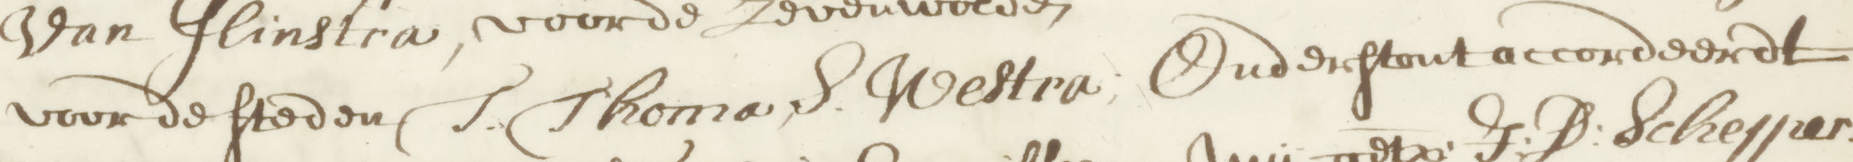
voor de steden T. Thoma, S. Westra; Onderstont accordeerdt
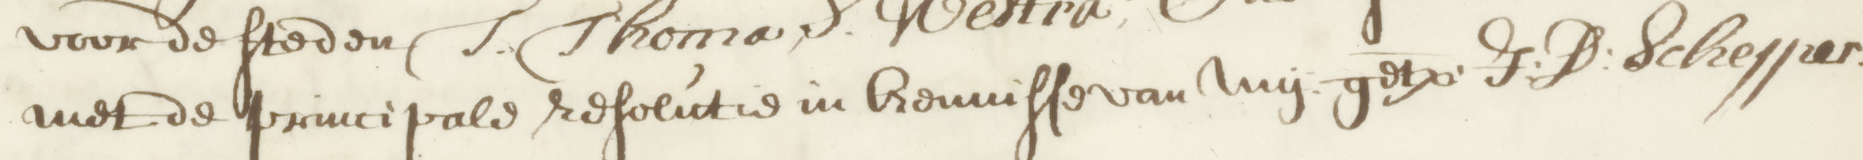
met de principale resolutie in kennisse van mij getk. J.D: Schepper.
